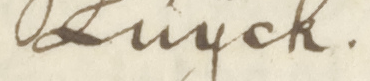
Luijck
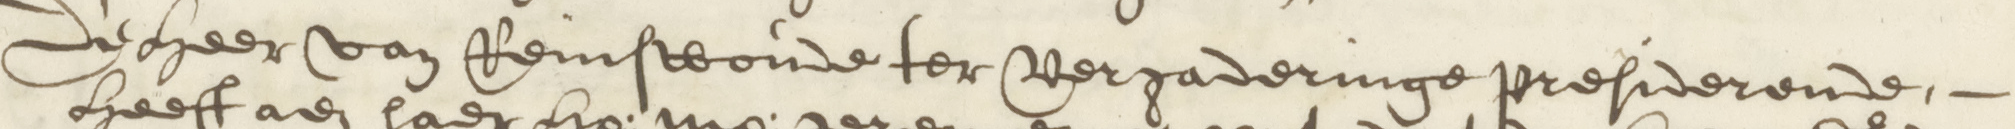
De heer Reinswoude ter vergaderinge presiderende -
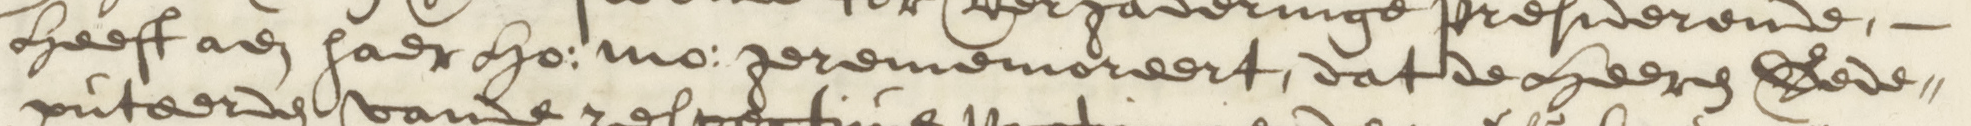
heeft aen haer Ho:Mo: gerememoreert, dat de heeren Gede„
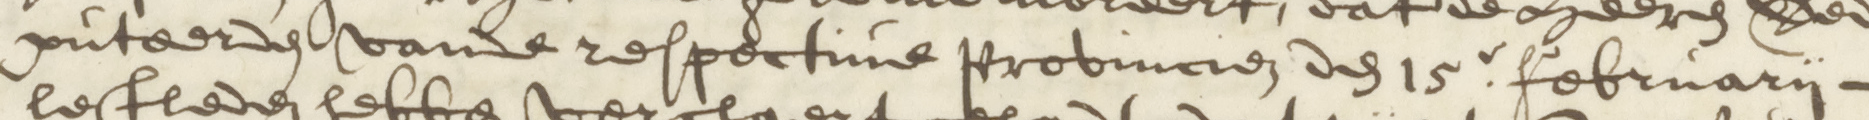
puteerden vande respectiue provincien, de 15e. februarij -
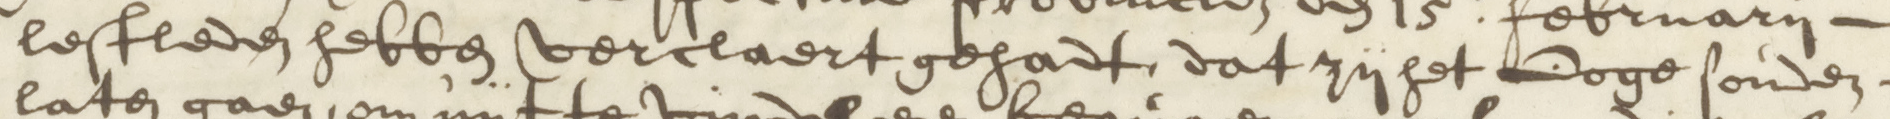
lestleden hebben verclaert gehadt, dat zij het Ooge souden
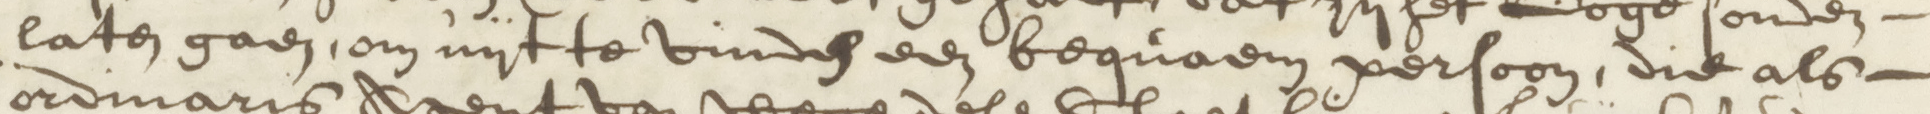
laten gaen om uijt te vinden een bequamen persoon, die als -
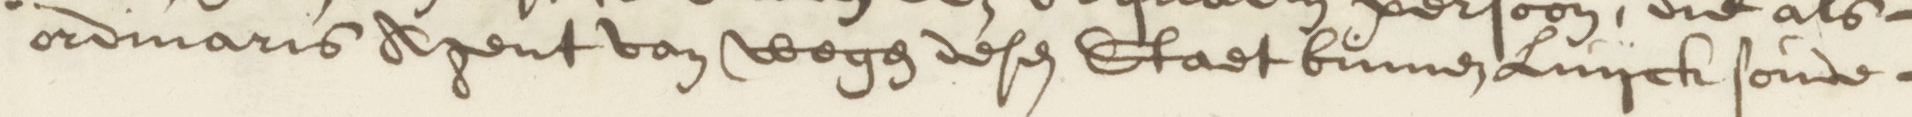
ordinaris Agent van wegen desen Staet binnen Luijck soude
